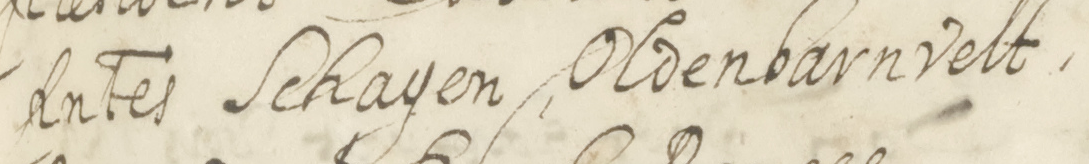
Pntes Schagen, Oldenbarnvelt
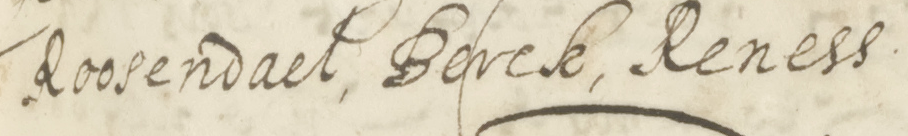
Roosendael, Berck, Reness.
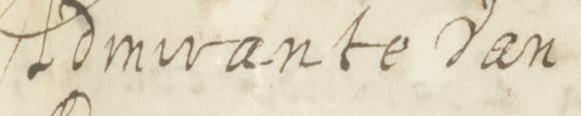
Admirante van
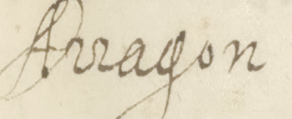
Arragon
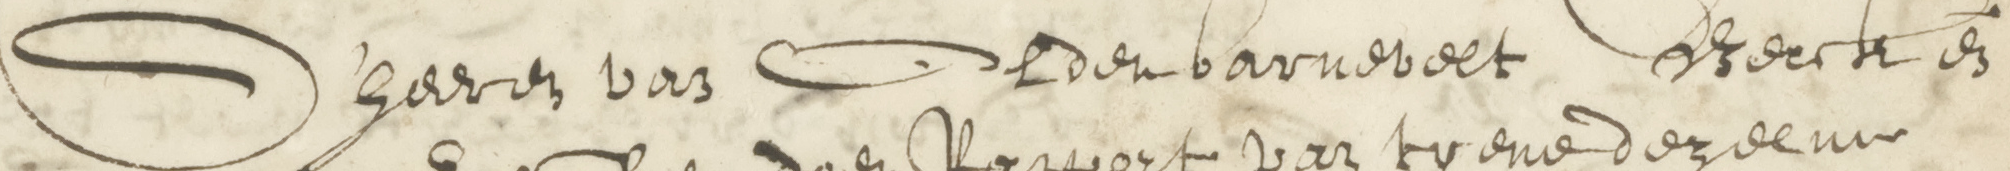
D'heeren van Oldenbarnevelt Berck en
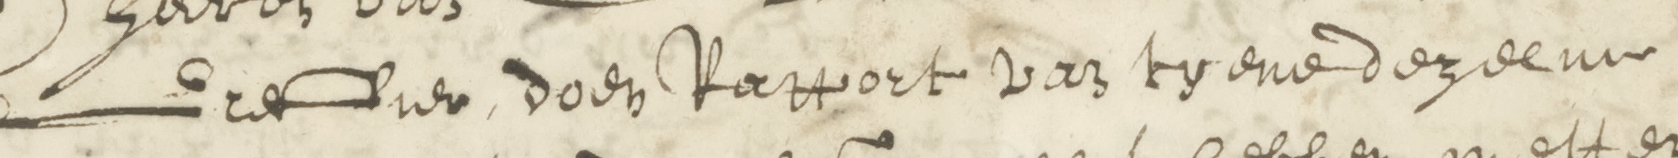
Greffier, doen Rapport van tgene dezelue
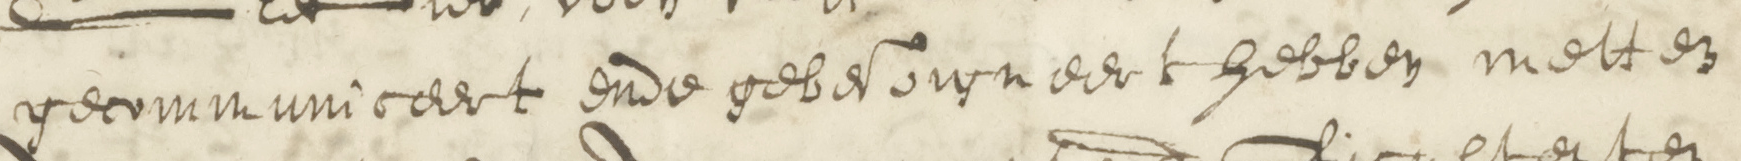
gecommuniceert ende gebesoigneert hebben metten
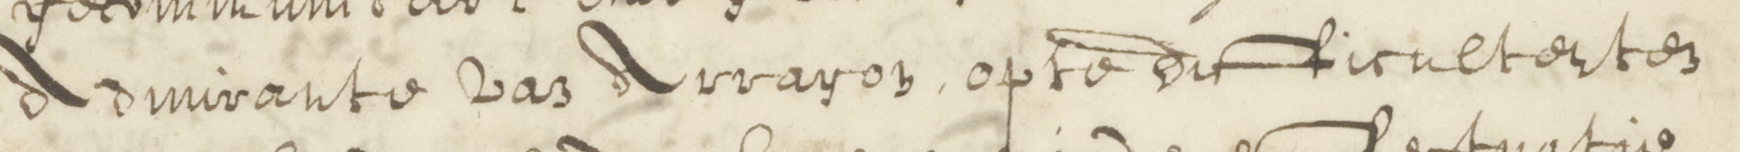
Admirante van Arragon, opte difficulteyten
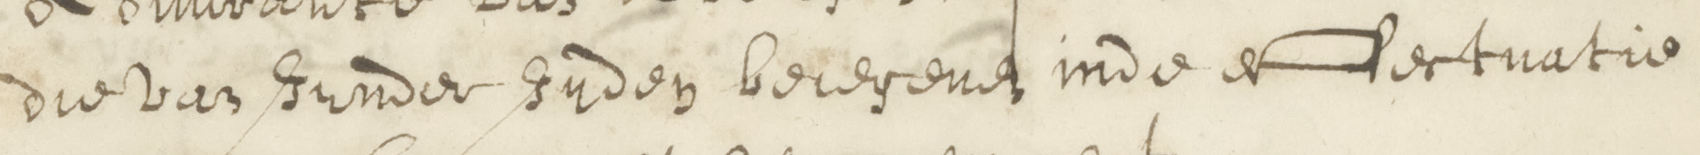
die van zynder zyden beregeuen inde effectuatie
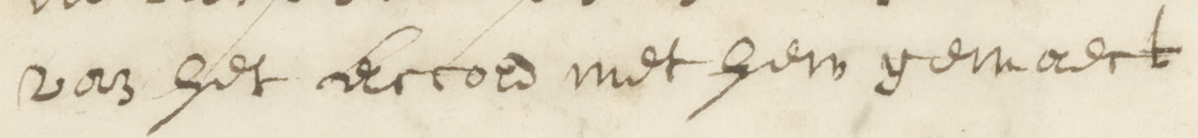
van het accord met hem gemaect.
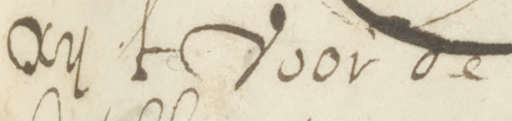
xiie L Voor de
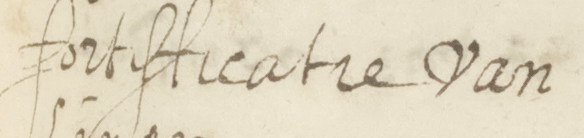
fortifficatie van
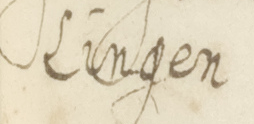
Lingen
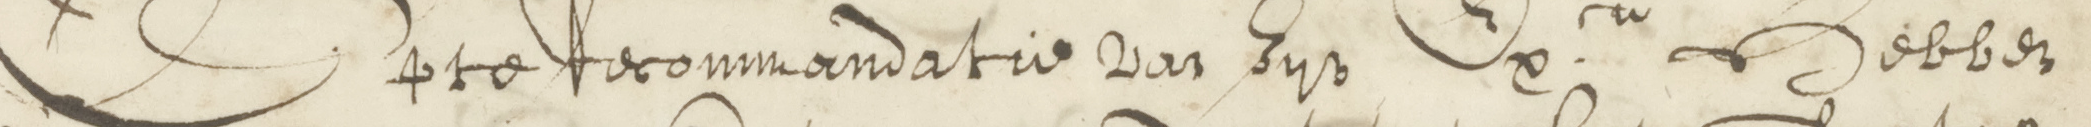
Opte Recommandatie van zyn Excie hebben
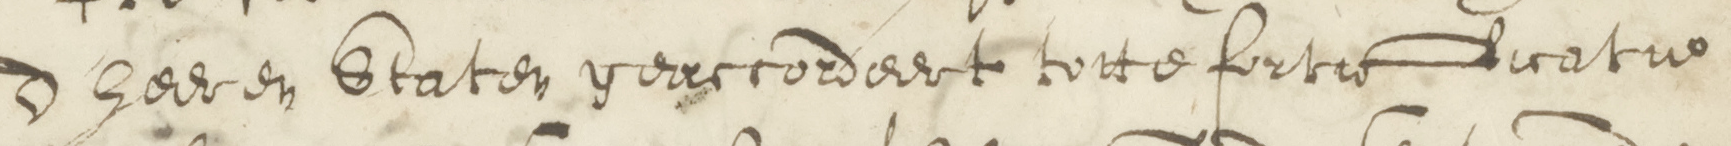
D'heeren Staten geaccordeert totte fortifficatie
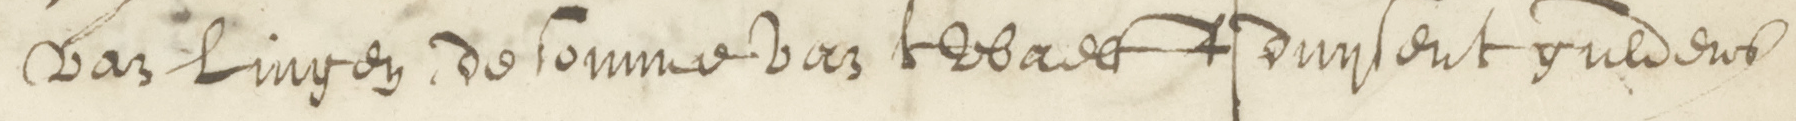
van Lingen de somme van twaelff duysent guldens
